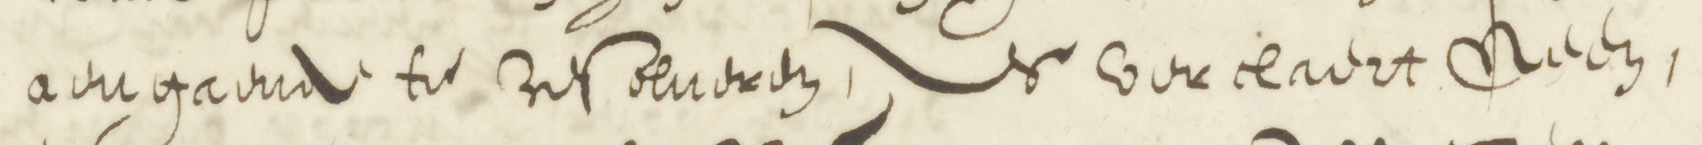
aengaende te resolueren, Es verclaert Neen,
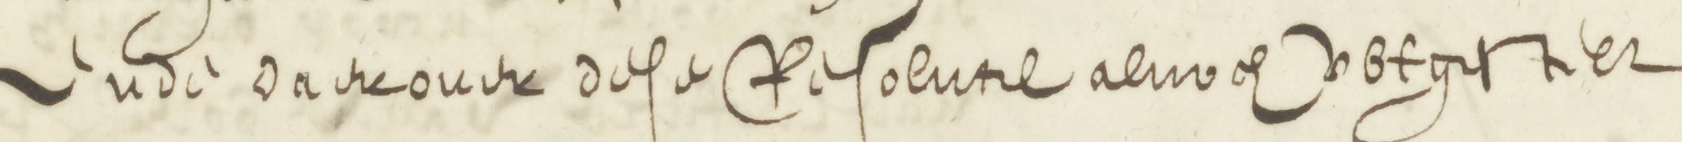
ende daerouer dese Resolutie alnoch Wtgestelt
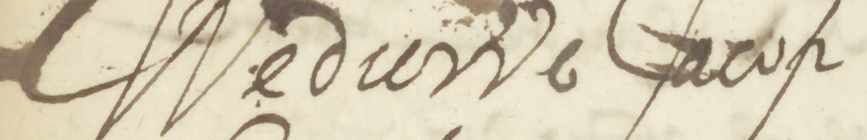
Weduwe Jacop
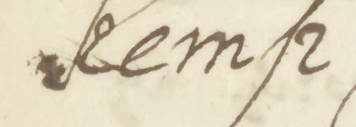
Kemp
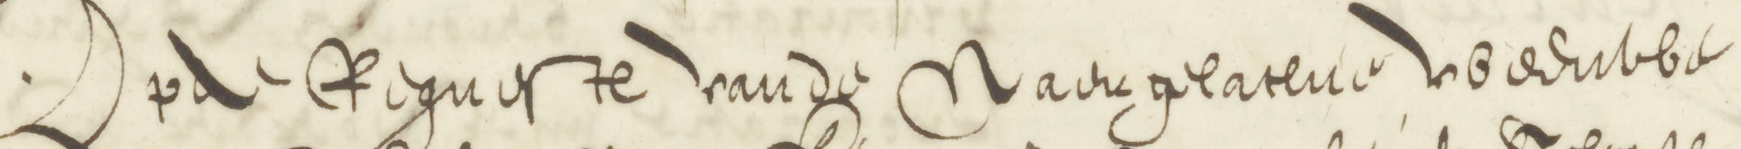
Opde Requeste vande naergelatene weduwe
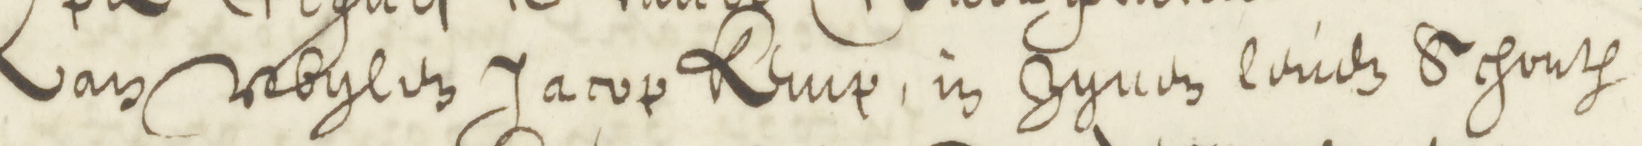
van wylen Jacop Kemp, in zynen leven Schouth
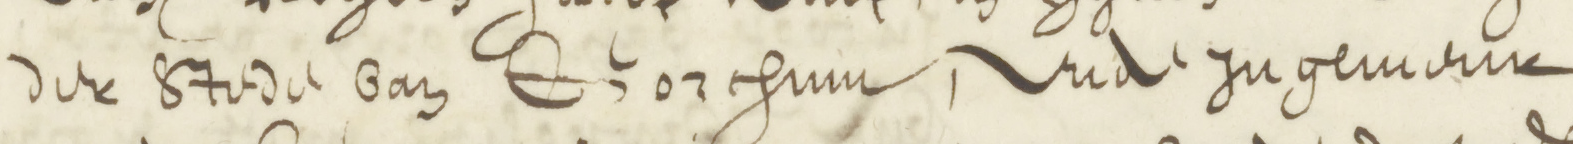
der Stede van Gorchum, ende Ingenieur
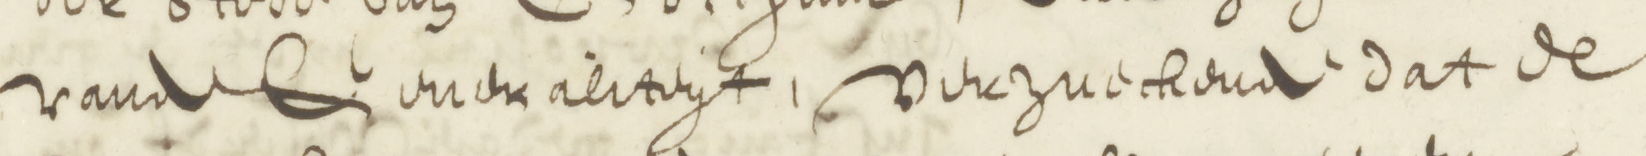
vande Generaliteyt, verzueckende dat de
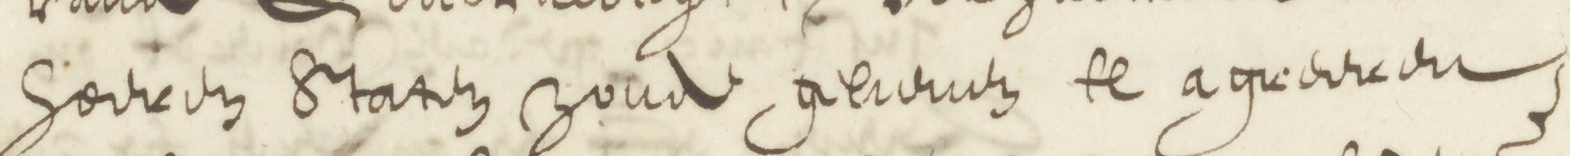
heeren Staten zoude gelieuen te agreeren
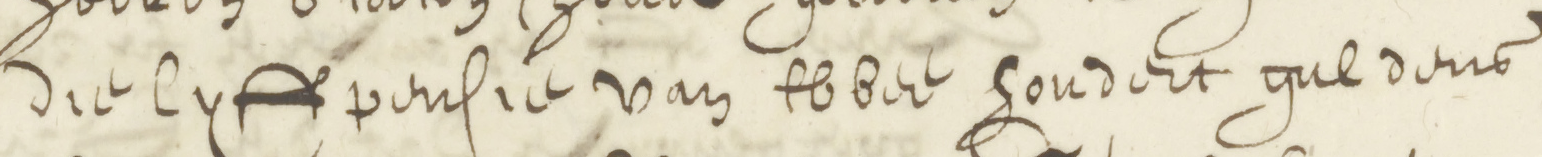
die lyffpensie van twee hondert guldens
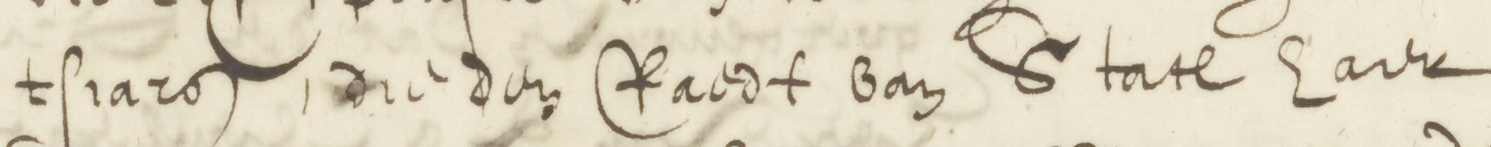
tsiars, die den Raedt van State haer
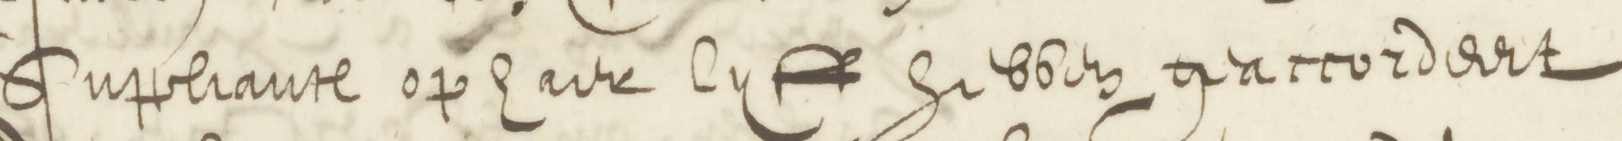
Suppliante op haer lyff hebben geaccordeert
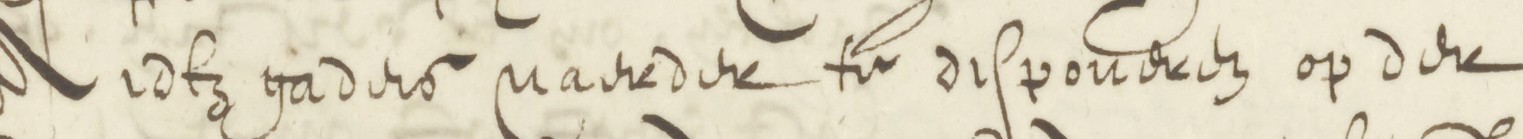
Midtzgaders naerder te disponeren op der
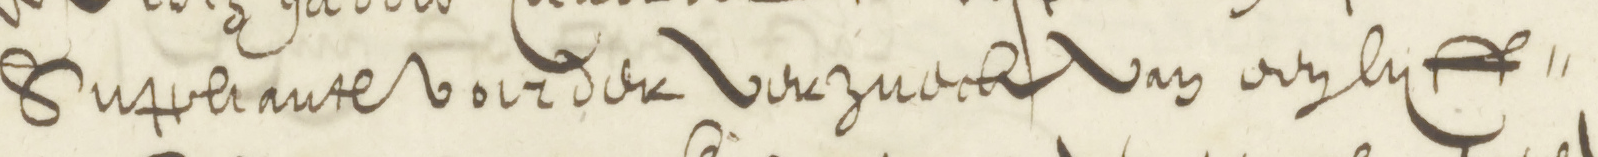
Suppliante voirder verzueck van een lyff„
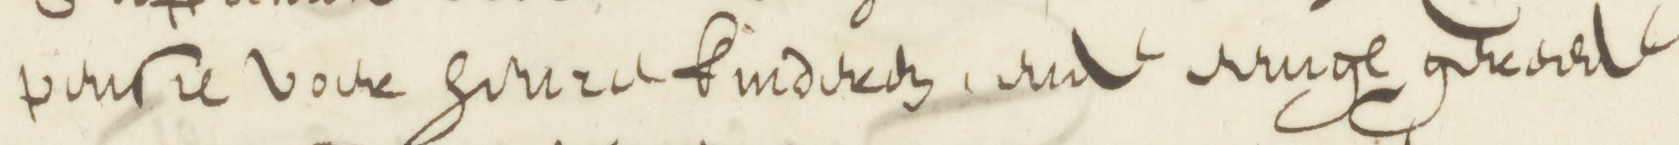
pensie voer heure kinderen, ende eenigh gereede
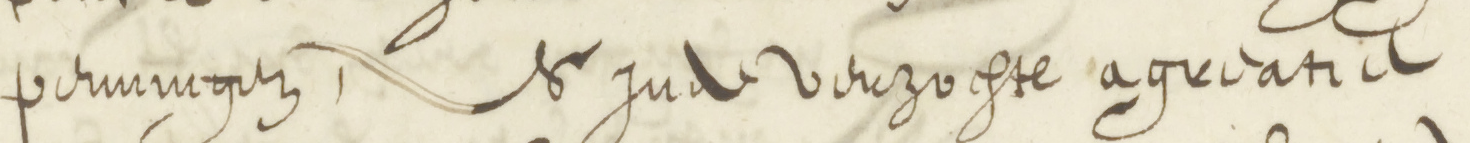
penningen. Is inde verzochte agreatie
